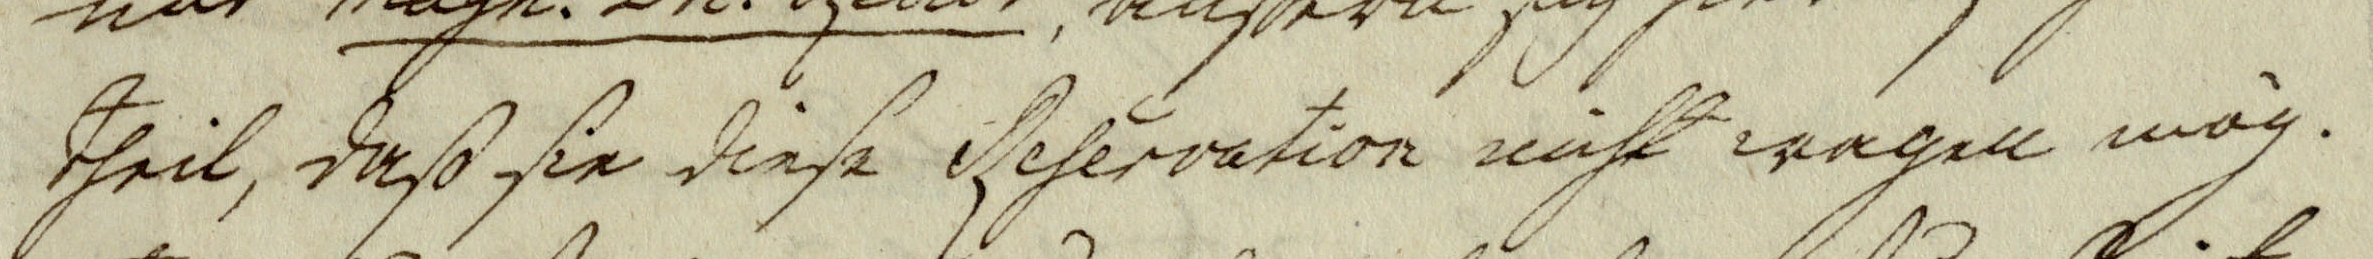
Theil, daß sie diese Reservation nicht wagen mög¬
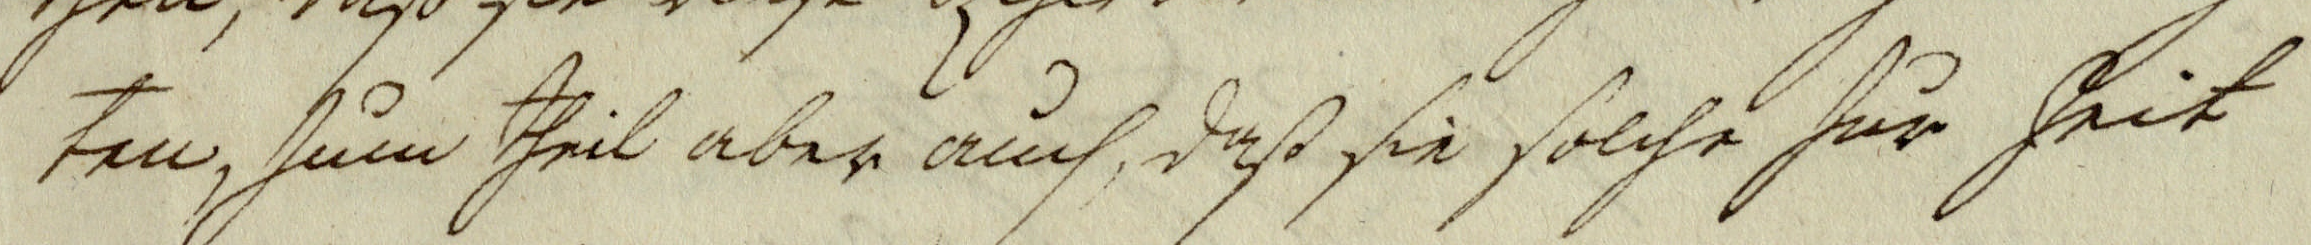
ten, zum Theil aber auch, daß sie solche zur Zeit
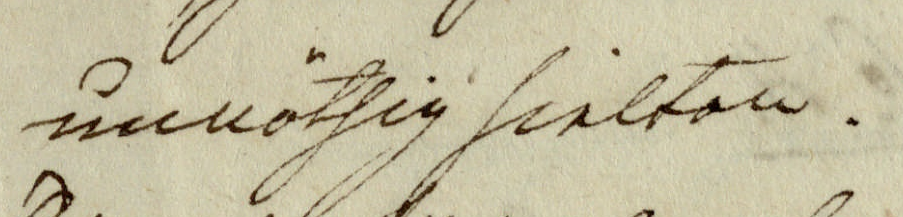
unnöthig hielten.
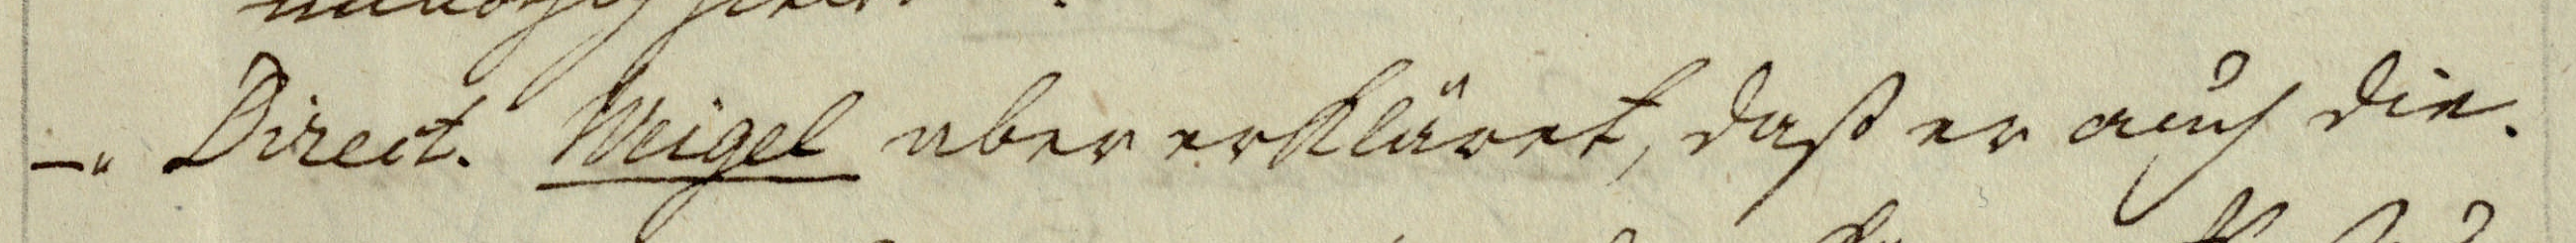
— " Direct. Weigel aber erklärt, daß er auch die¬
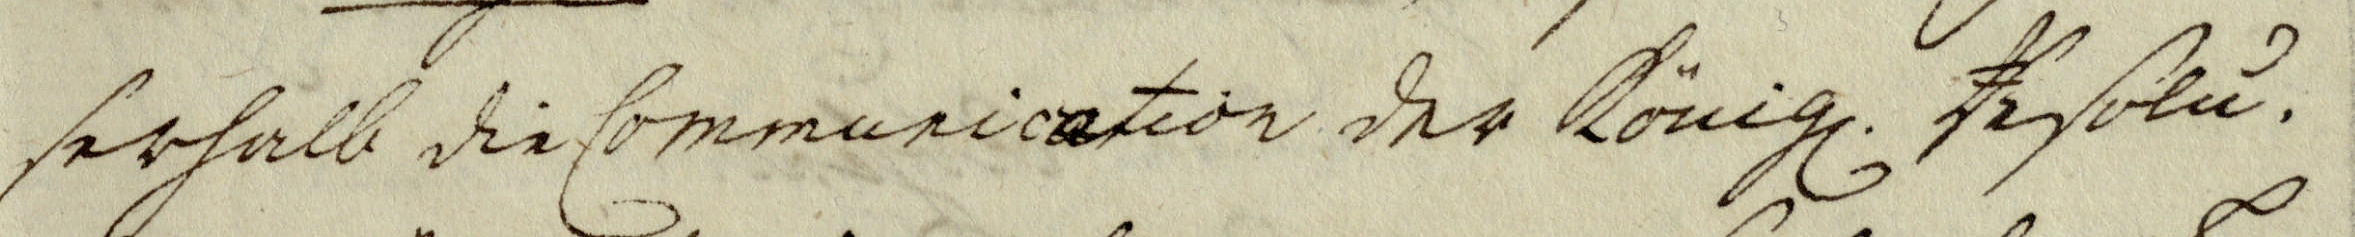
serhalb die Communication der Königl. Resolu¬
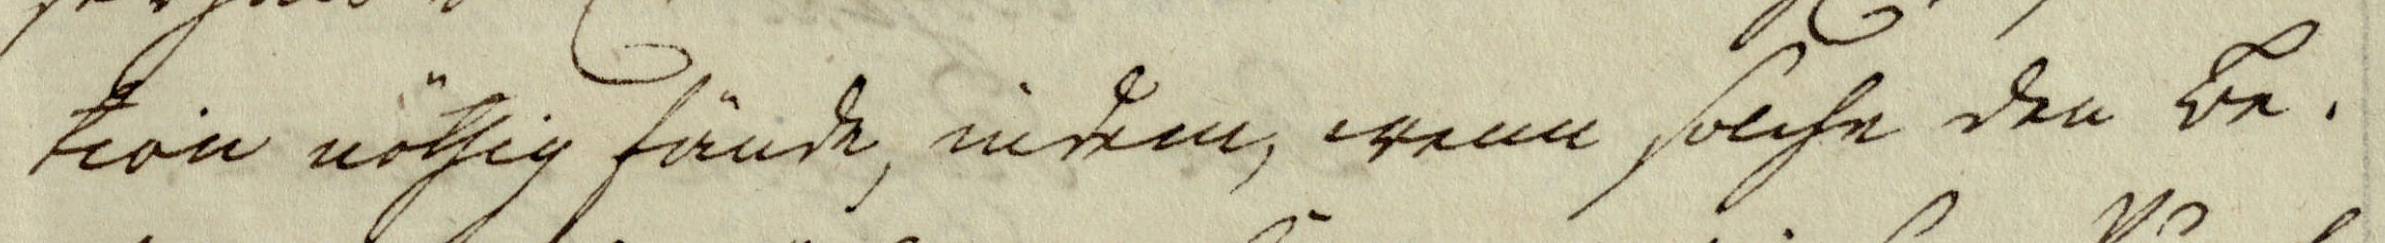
tion nöthig fände, indem, wenn solche den Be¬
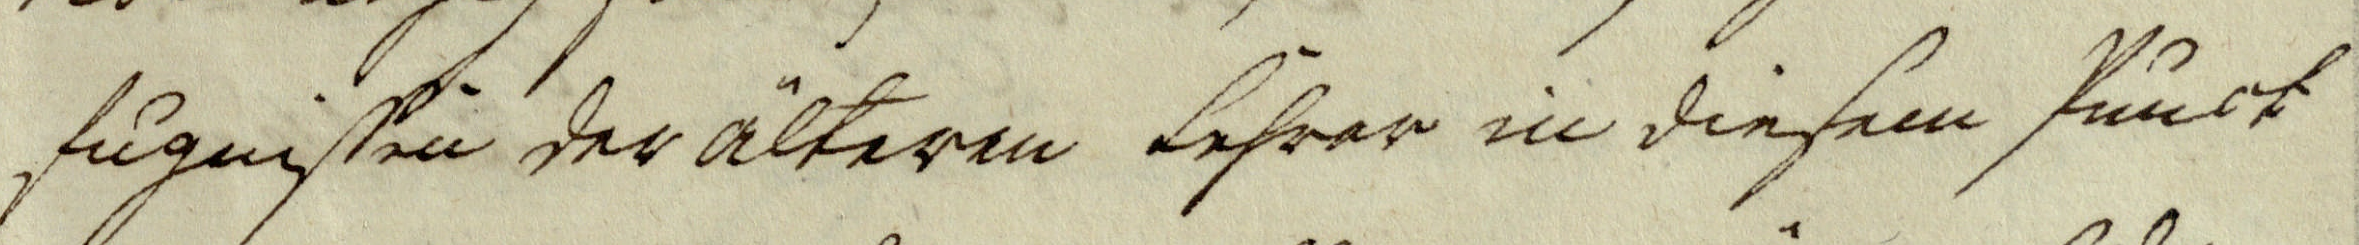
fugnissen der älteren Lehrer in diesem Punct
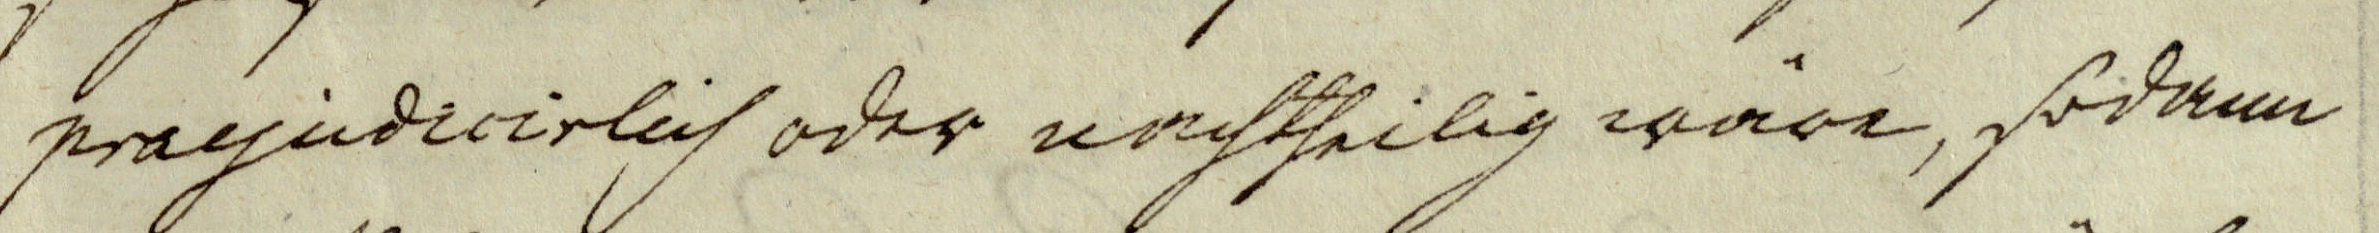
praejudicirlich oder nachtheilig wäre, sodann
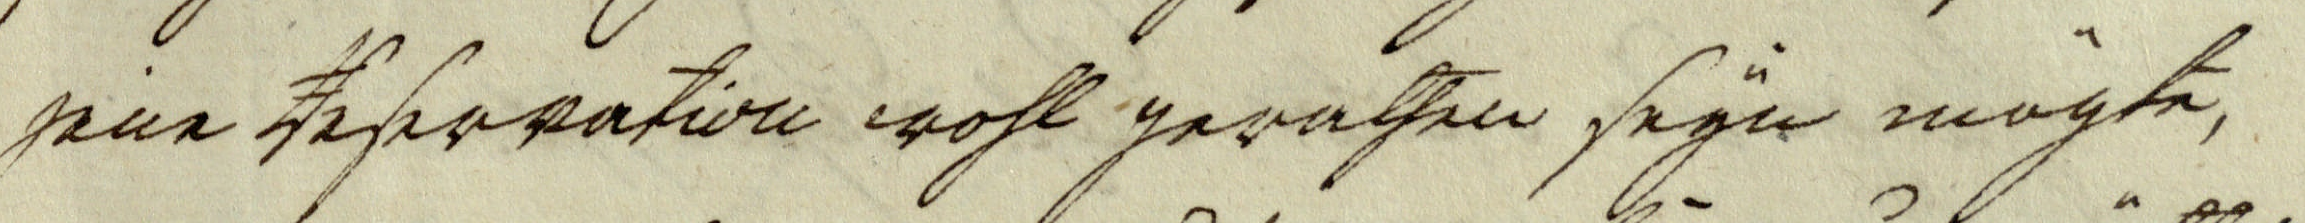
jene Reservation wohl gerathen seÿn mögte,
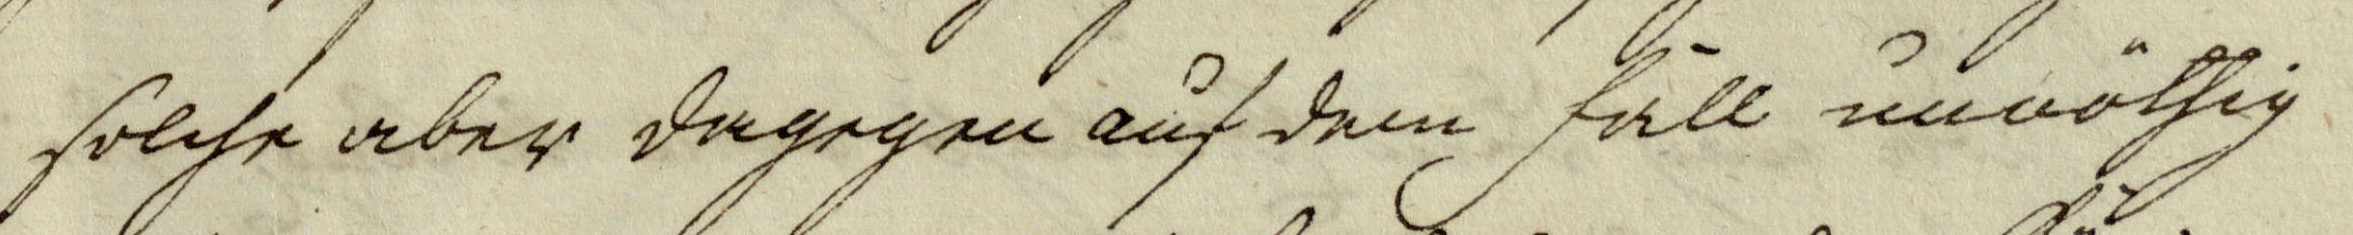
solche aber dagegen auf dem Fall unnöthig
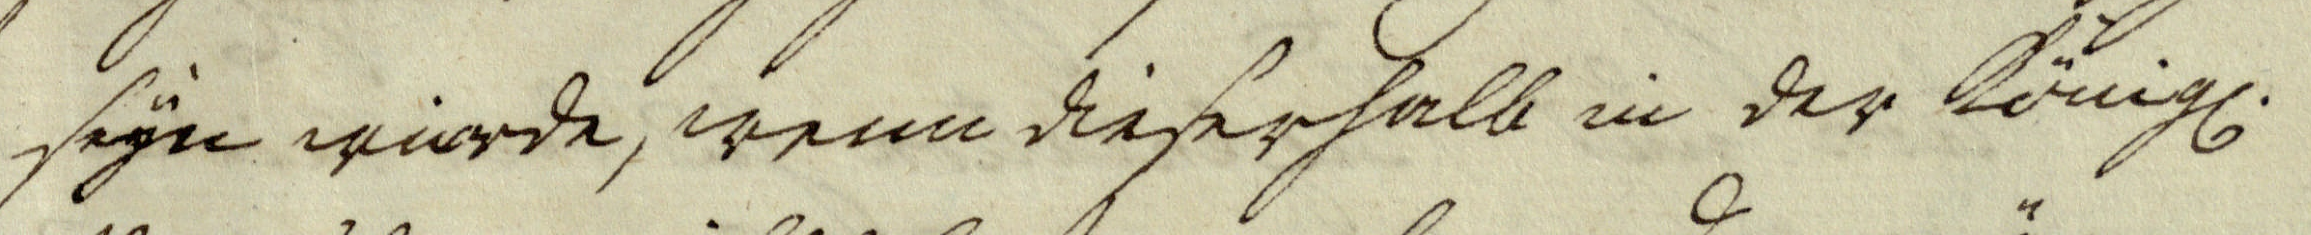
seÿn würde, wenn dieserhalb in der Königl.
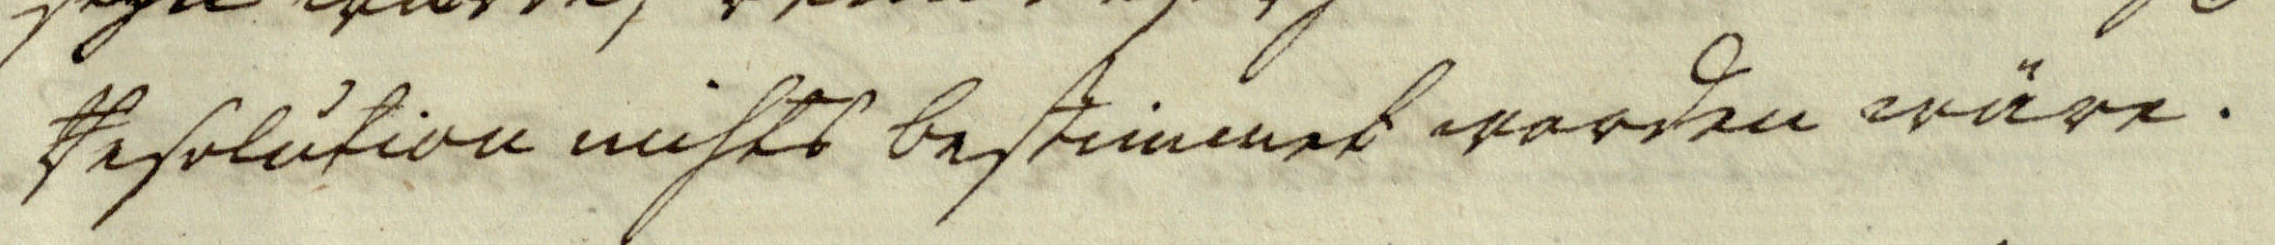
Resolution nichts bestimmt worden wäre.
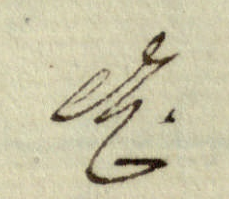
dh.
